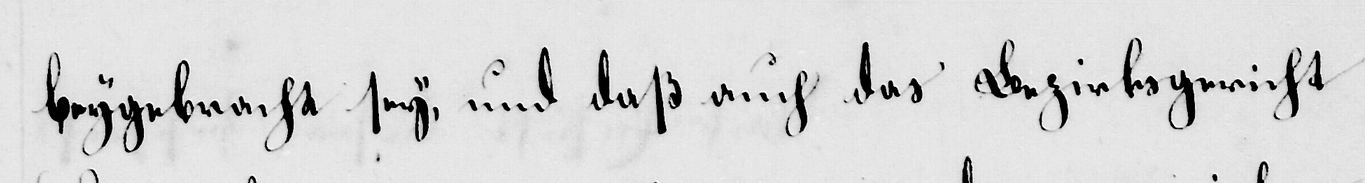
beygebracht sey, und daß auch das Bezirksgericht
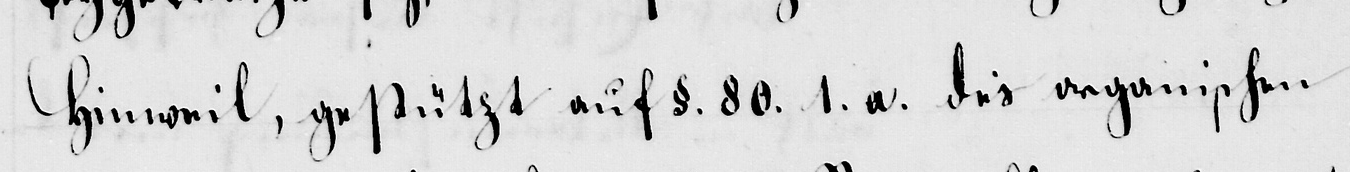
Hinweil, gestützt auf §. 80. 1. a. des organischen
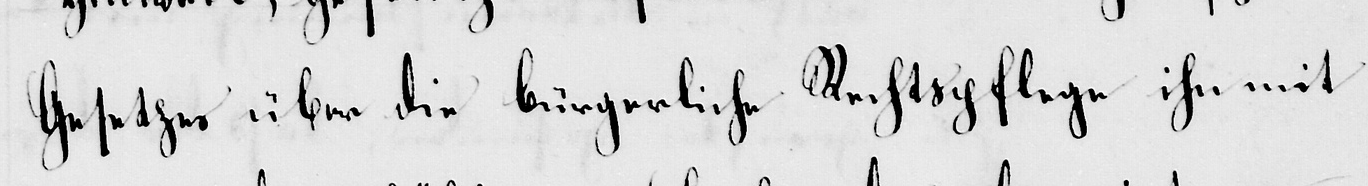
Gesetzes über die bürgerliche Rechtspflege ihn mit
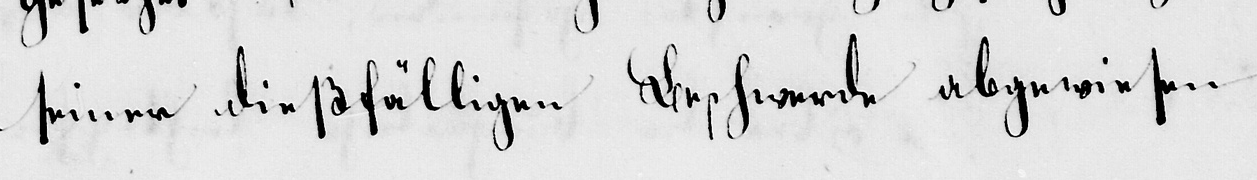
seiner dießfälligen Beschwerde abgewiesen
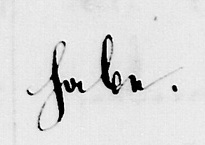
habe.
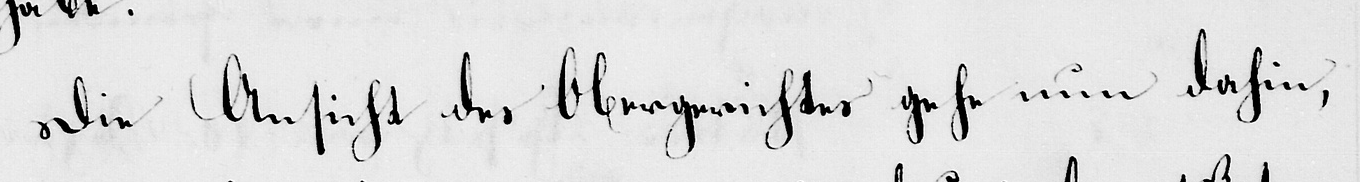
Die Ansicht des Obergerichtes gehe nun dahin,
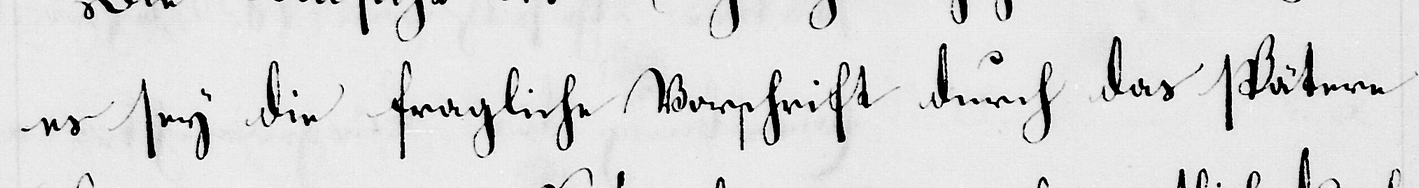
es sey die fragliche Vorschrift durch das spätere
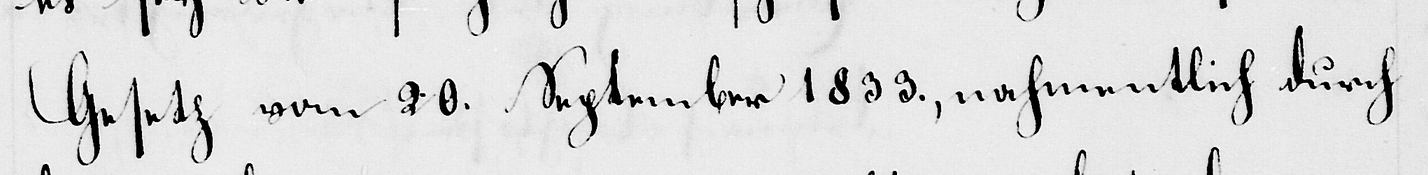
Gesetz vom 20. September 1833., nahmentlich durch
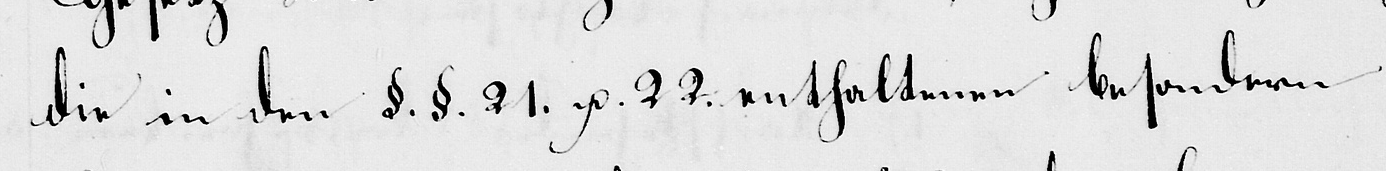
die in den §. §. 21. u. 22. enthaltenen besondern
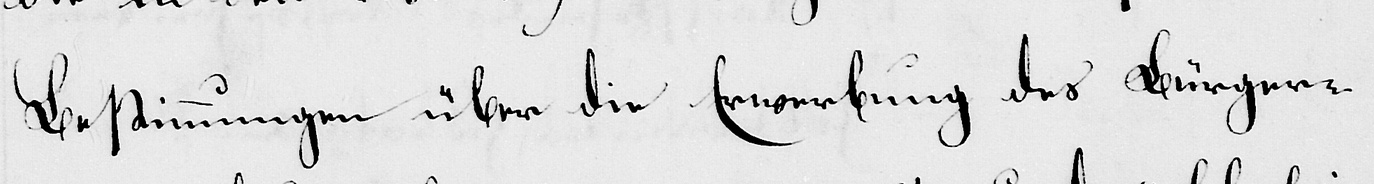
Bestimmungen über die Erwerbung des Bürger¬
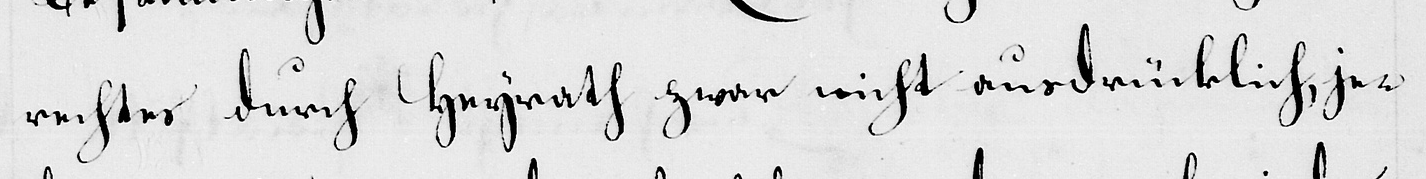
rechtes durch Heyrath zwar nicht ausdrücklich, je¬
